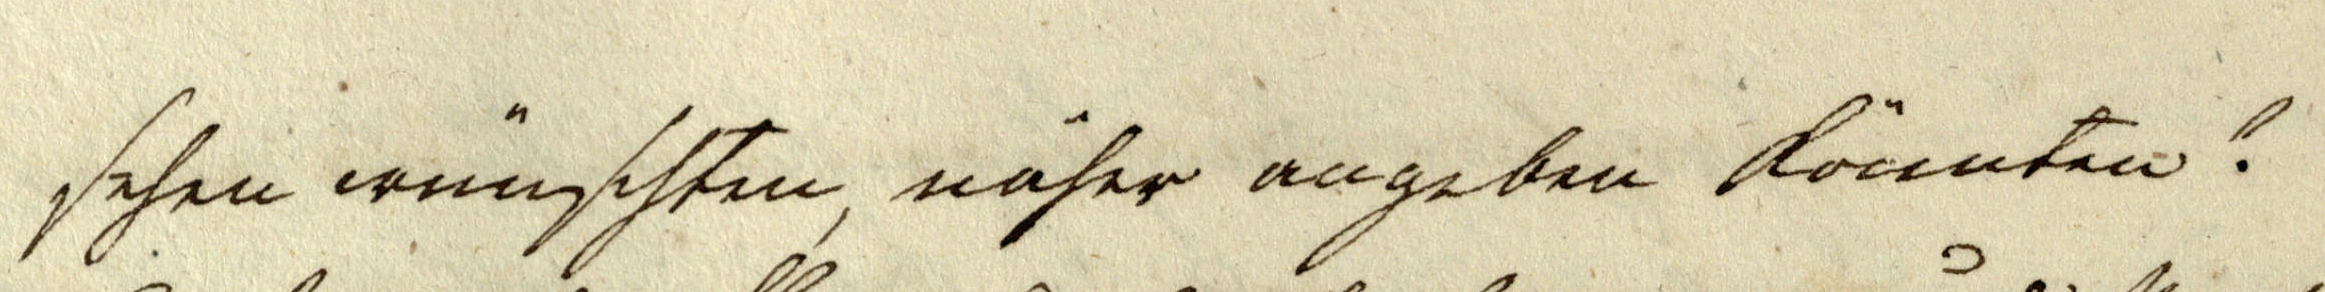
sehen wünschten, näher angeben könnten?
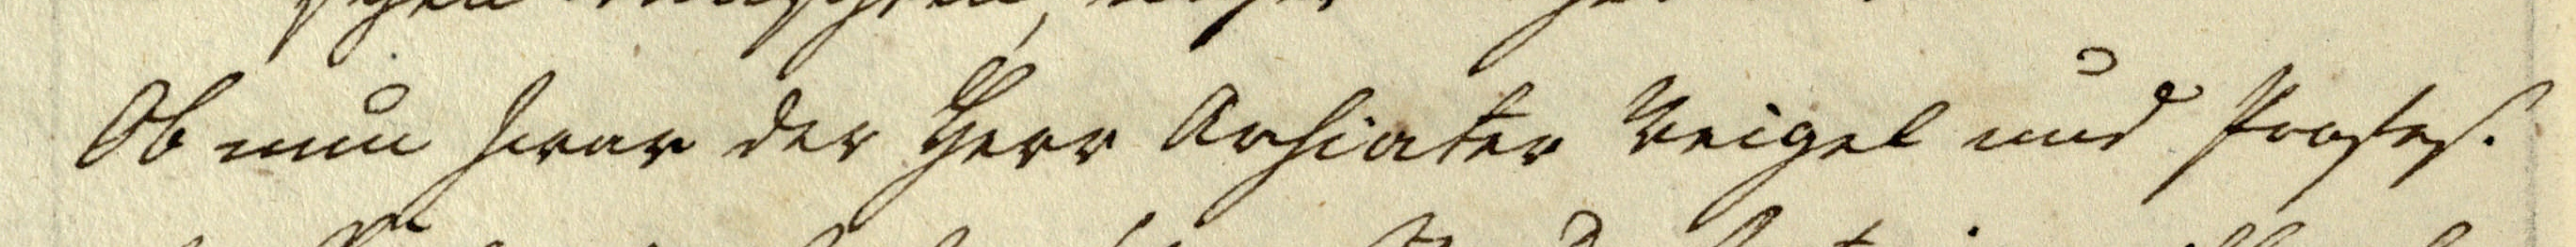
Ob nun zwar der Herr Archiater Weigel und Profes¬
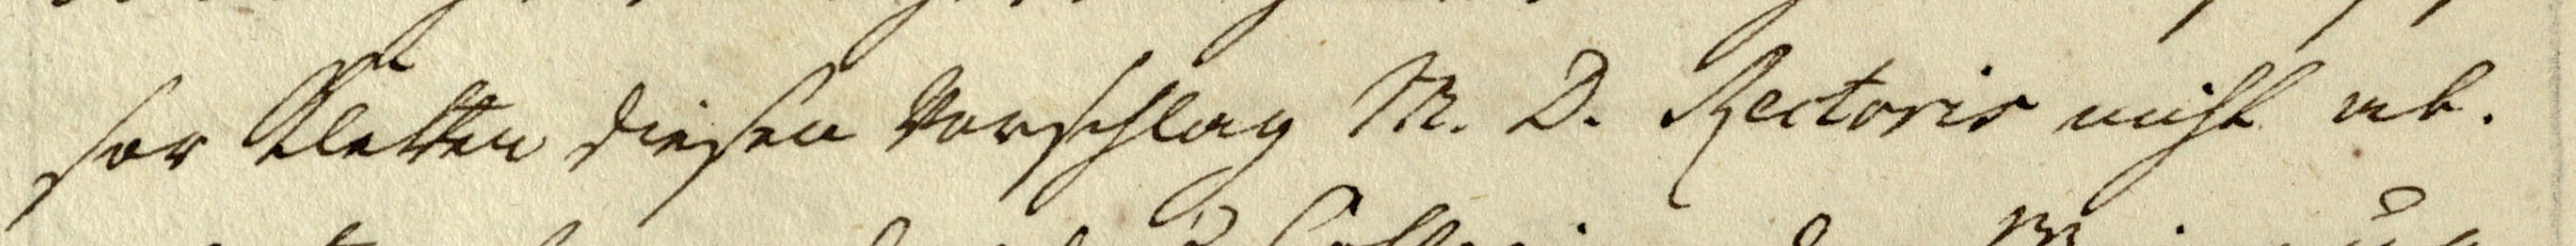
sor Kletten diesen Vorschlag M. D. Rectoris nicht ab¬
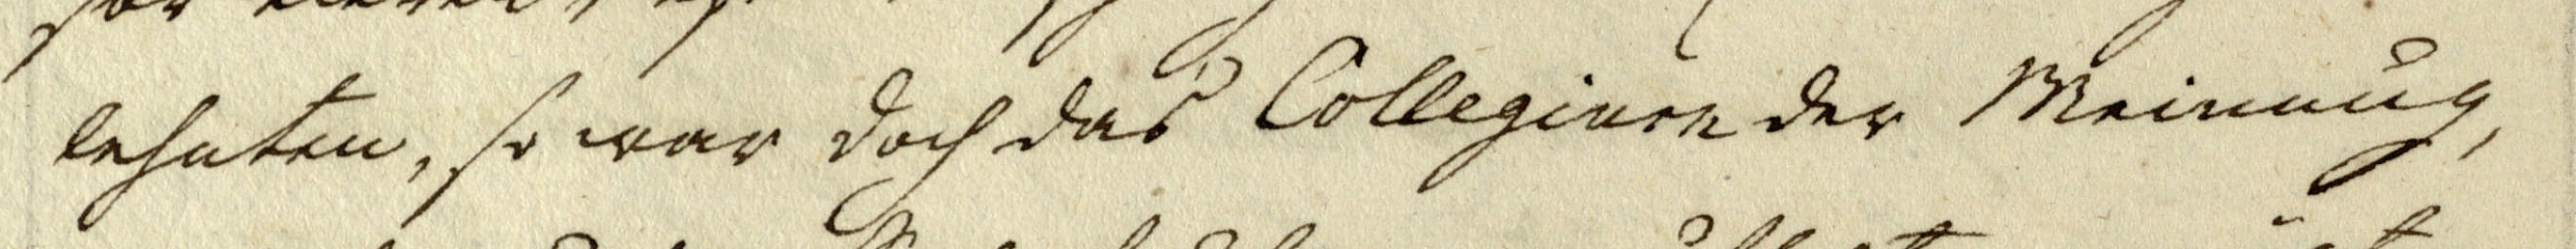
lehnten, so war doch das Collegium der Meinung,
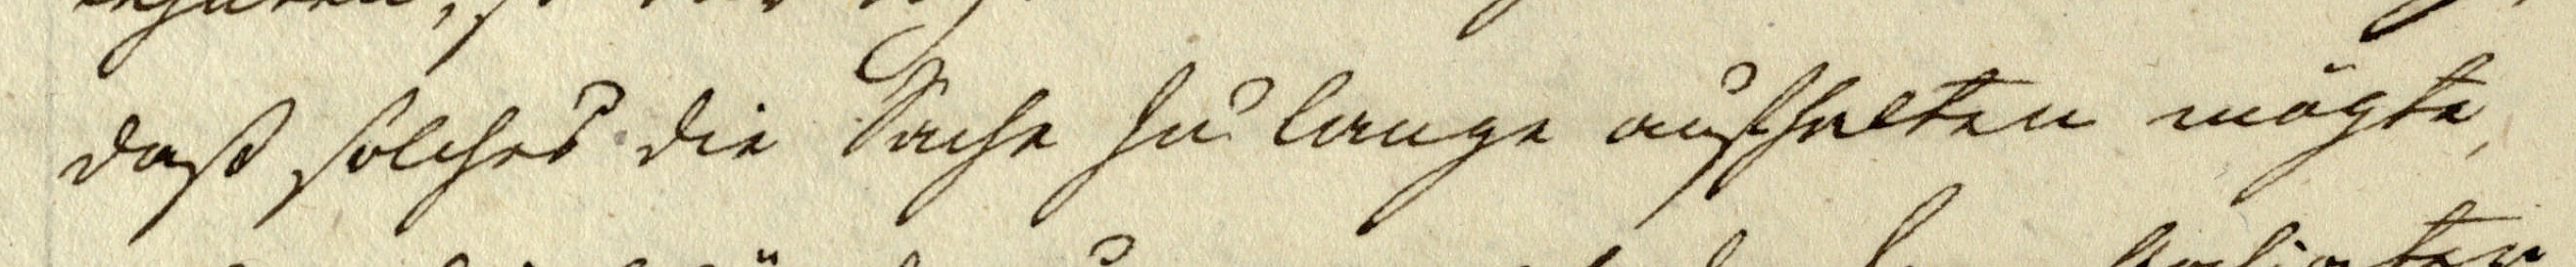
daß solches die Sache zu lange aufhalten mögte,
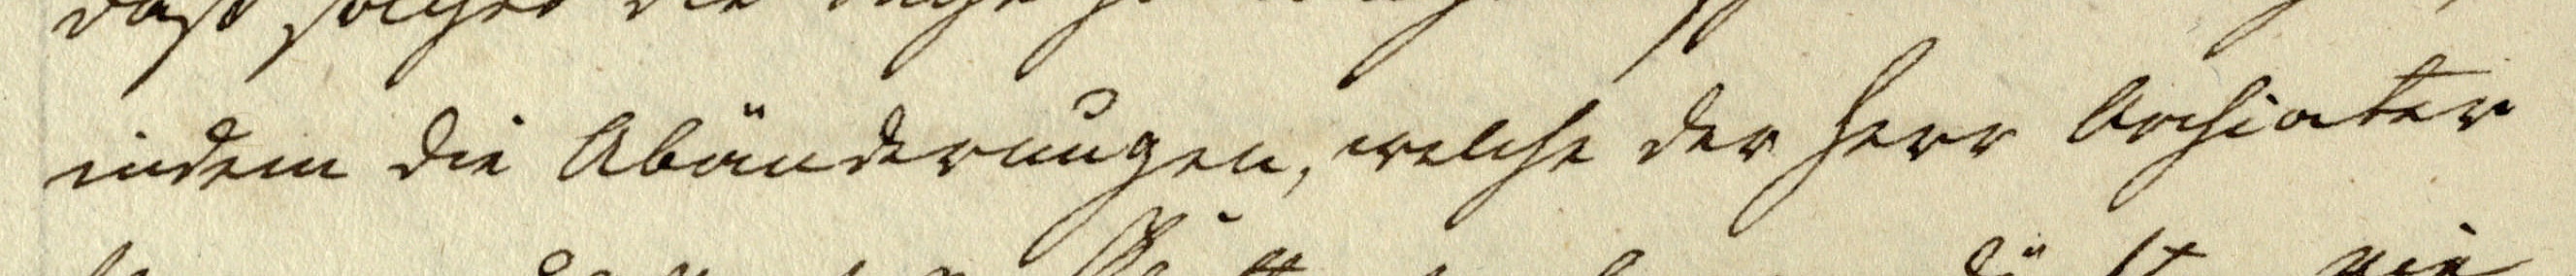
indem die Abänderungen, welche der Herr Archiater
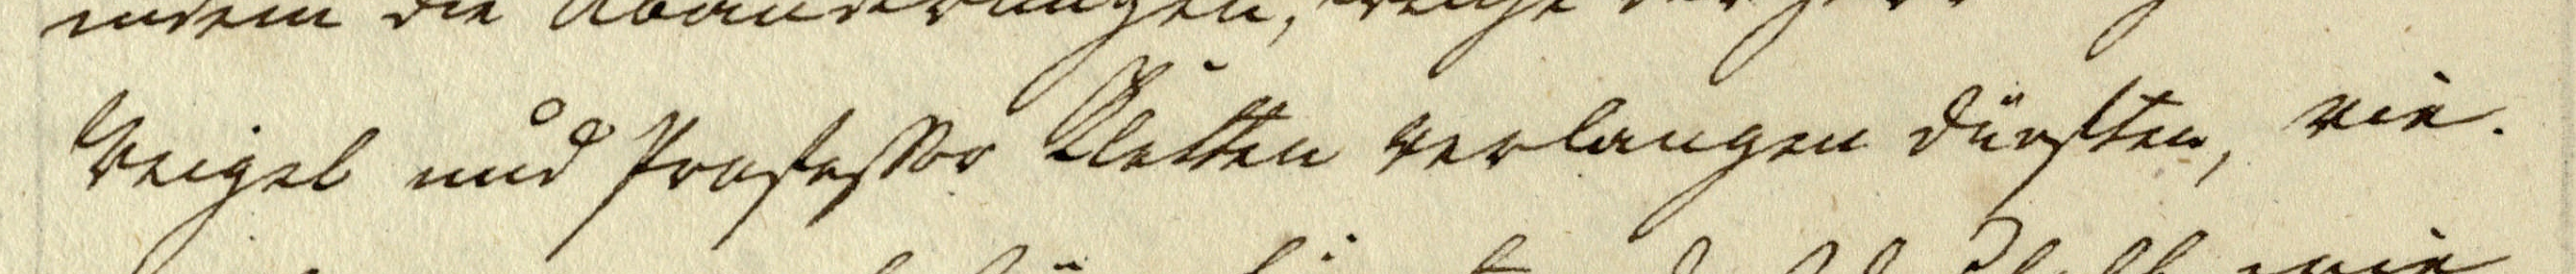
Weigel und Professor Kletten verlangen dürften, vie¬
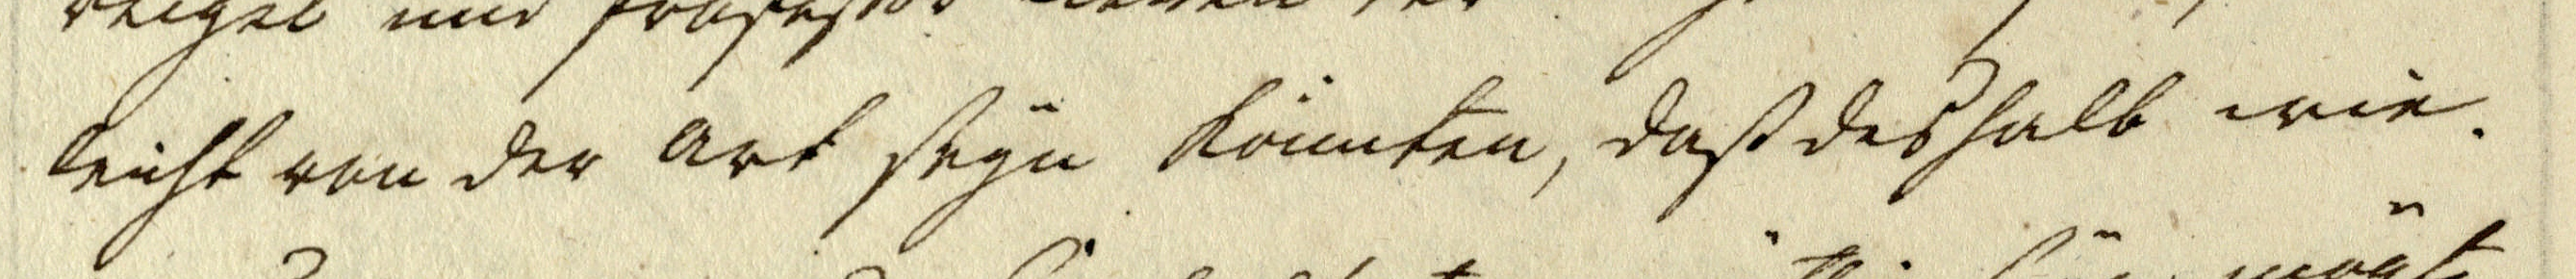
leicht von der Art seÿn könnten, daß deshalb wie¬
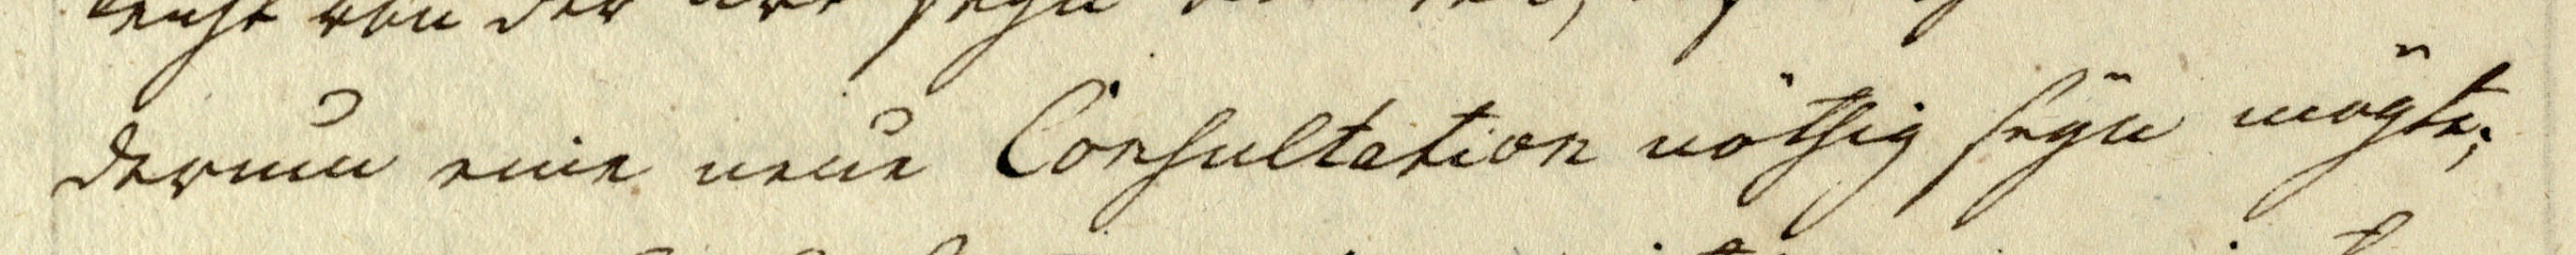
derum eine neue Consultation nöthig seyn mögte;
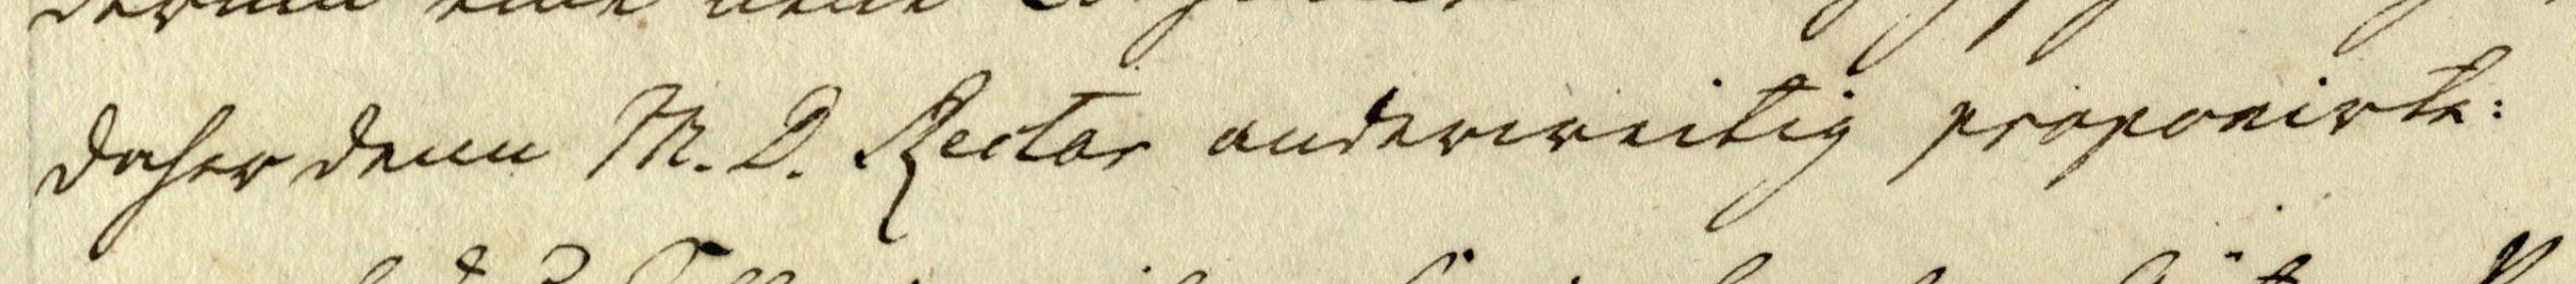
daher denn M. D. Rector anderweitig proponirte:
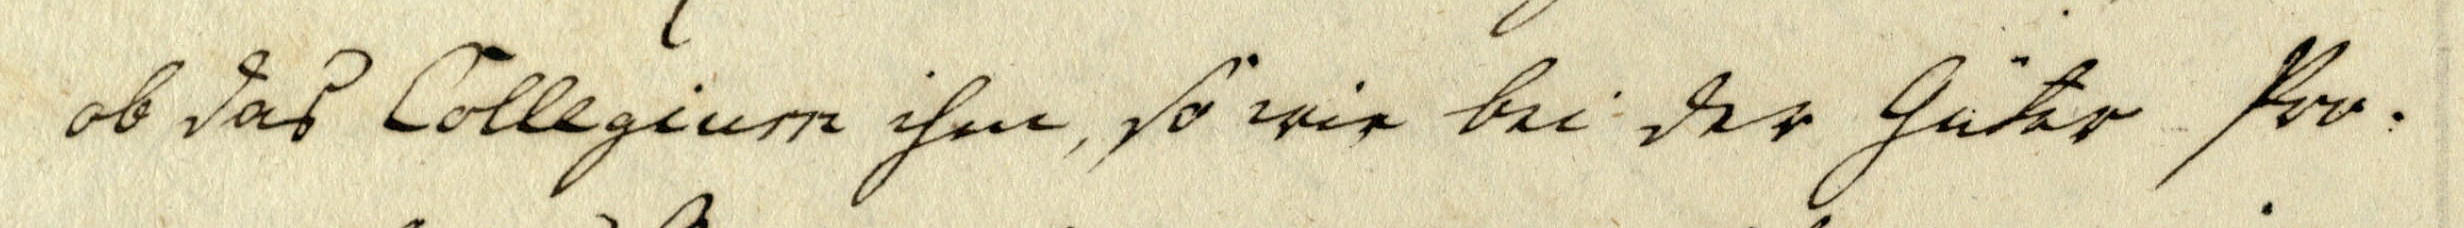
ob das Collegium ihm, so wie bei der Güter Pro¬
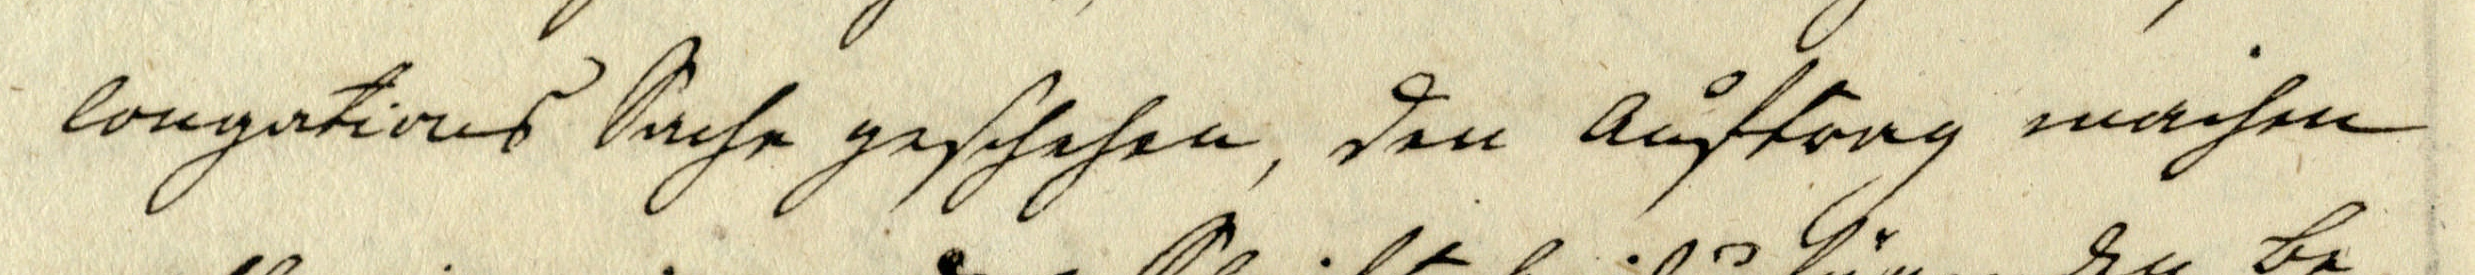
longations Sache geschehen, den Auftrag machen
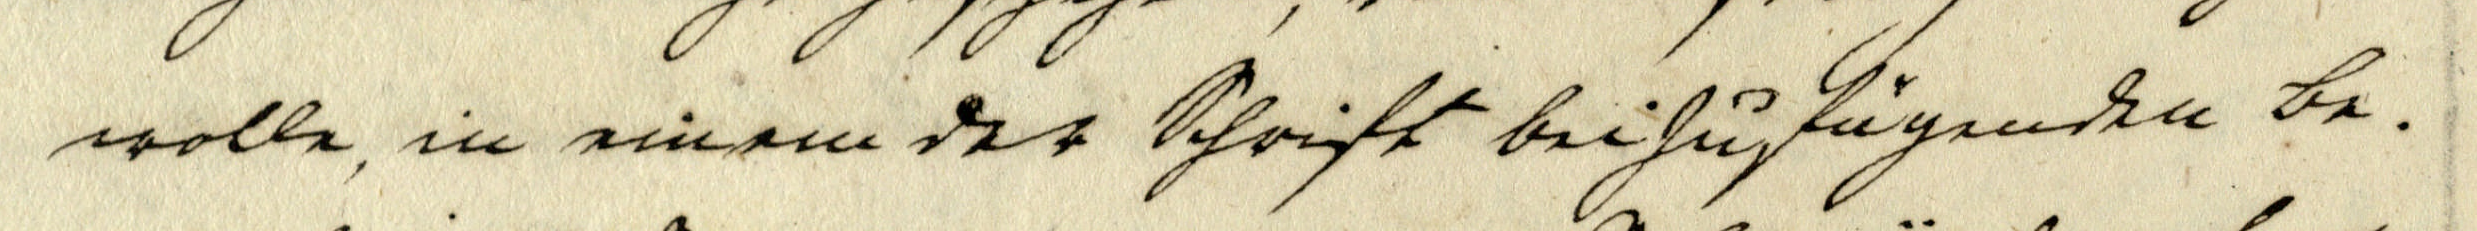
wolle, in einem der Schrift beizufügenden Be¬
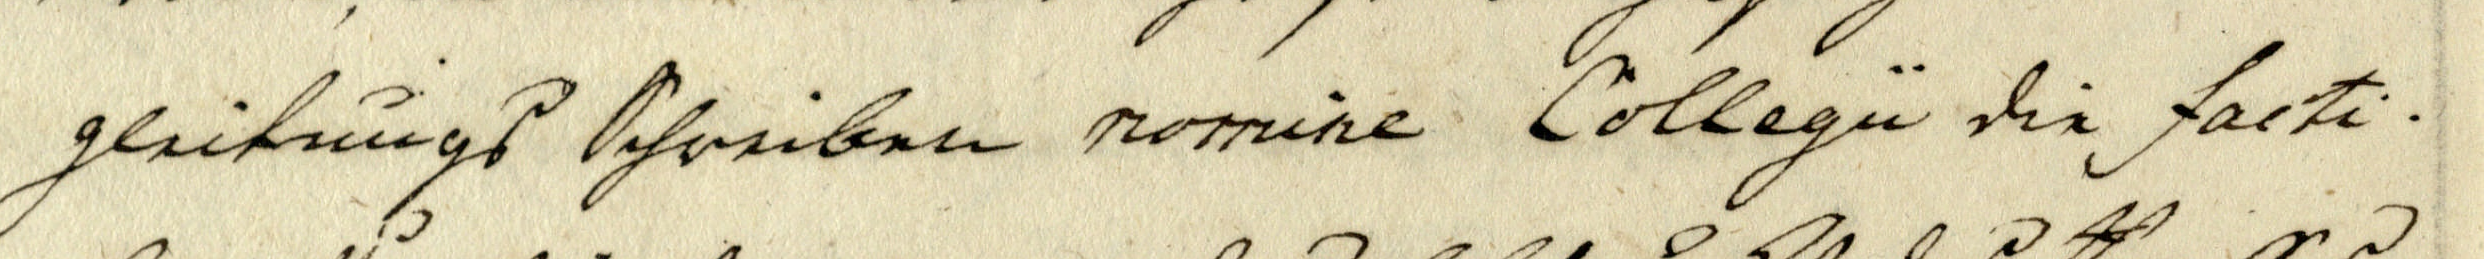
gleitungs Schreiben nomine Collegii die facti¬
